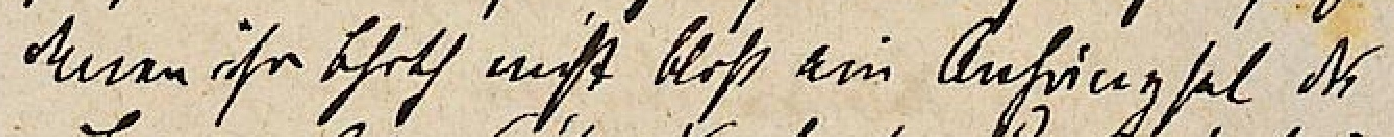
denen ihr Chrth nicht bloß ein Anhängsel ds
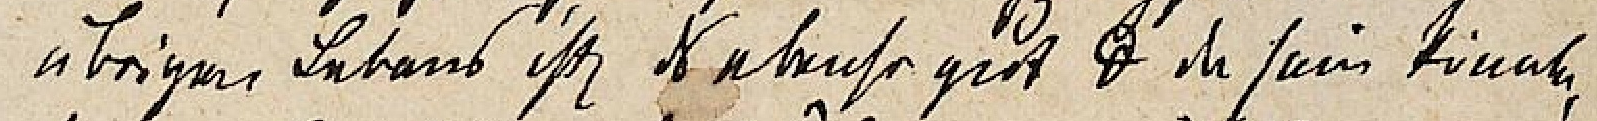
übrigen Lebens ist ds ebenso gut o da sein könnte,
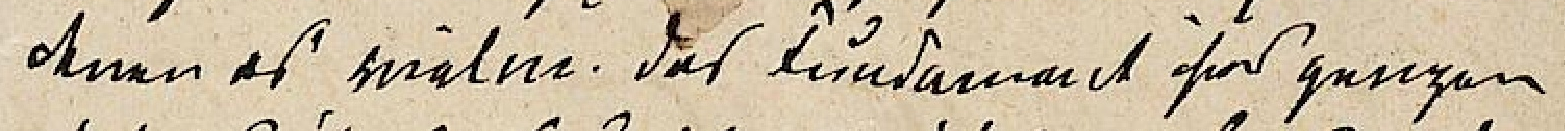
denen es vielm. das Fundament ihres ganzen
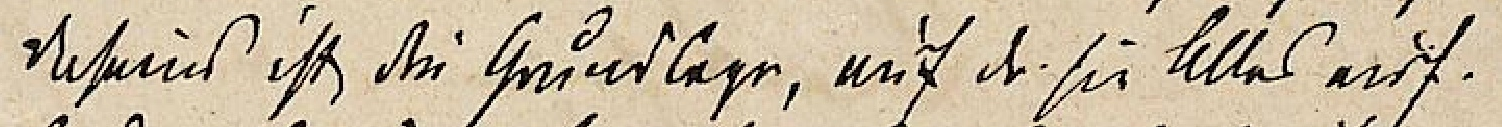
Daseins ist, die Grundlage, auf dr. sie Alles auf¬
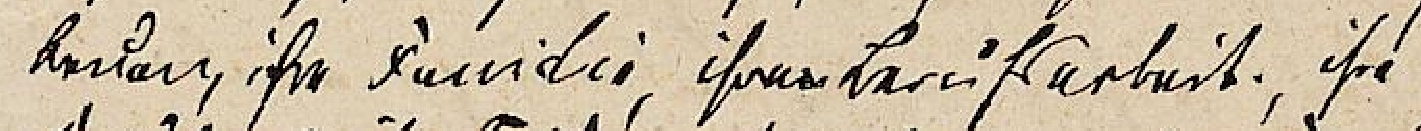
bauen, ihre Familie, ihre Berufsarbeit, ihre
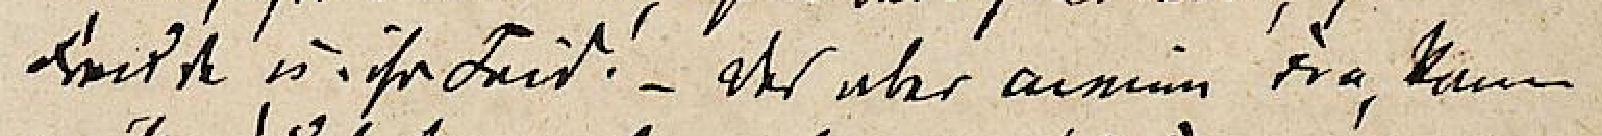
Freud u. ihr Leid.: Das aber meine Frn, kann
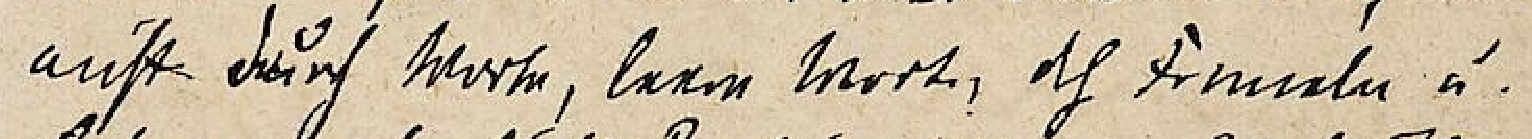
nicht durch Worte, leere Worte, dch Formeln u.
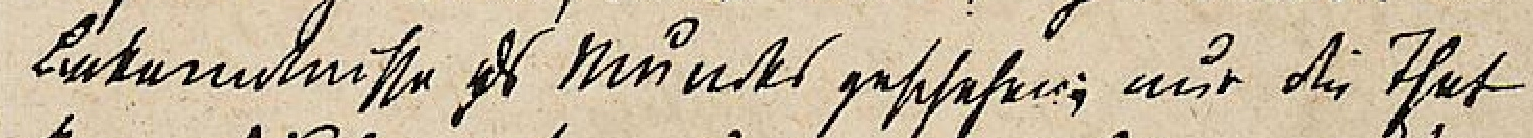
Bekenntnisse ds Mundes geschehen: nur die That
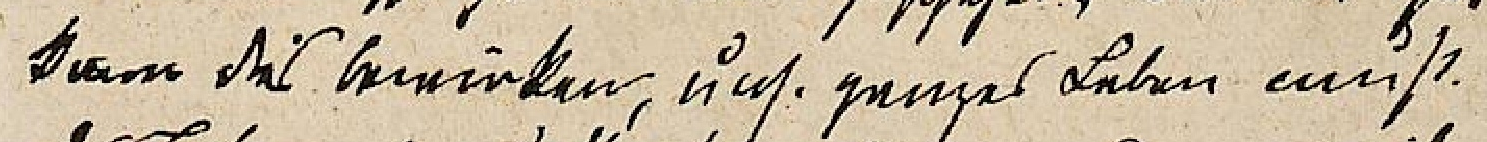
kann dies bewirken, uns. ganzes Leben muß
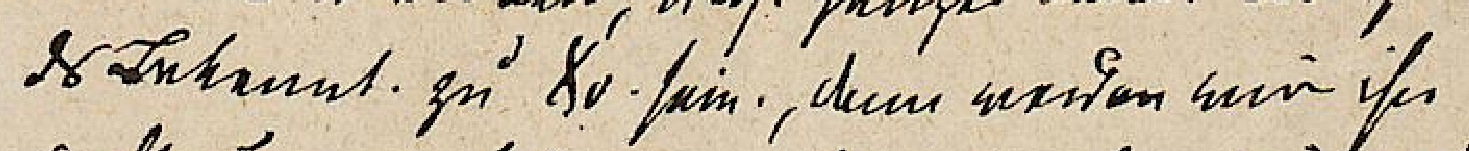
ds Bekennt. zu Χo sein., dann werden wir ihn
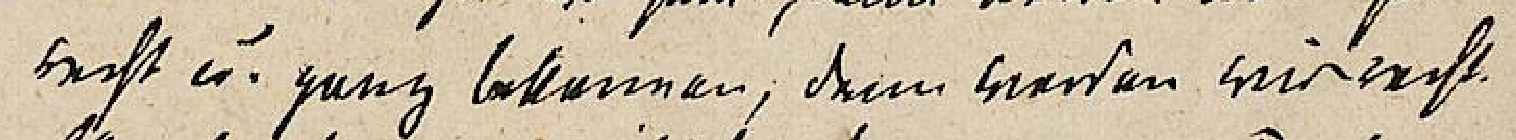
recht u. ganz bekennen, dann werden wir recht
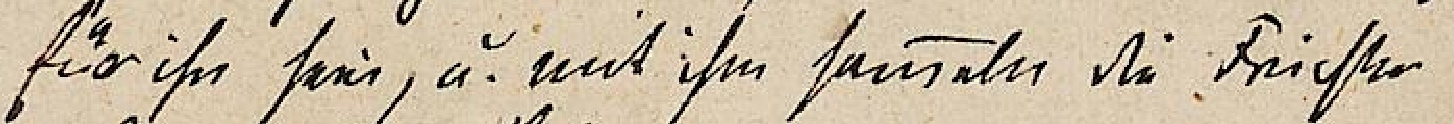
für ihn sein, u. mit ihm sameln die Früchte
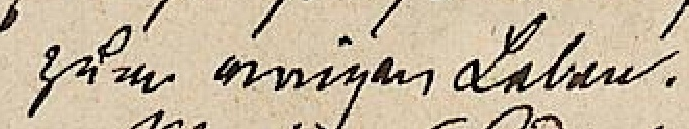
zum ewigen Leben
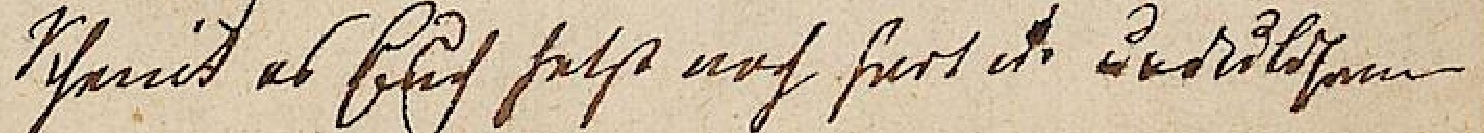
Scheint es Euch jetzt noch hart u. unduldsam
